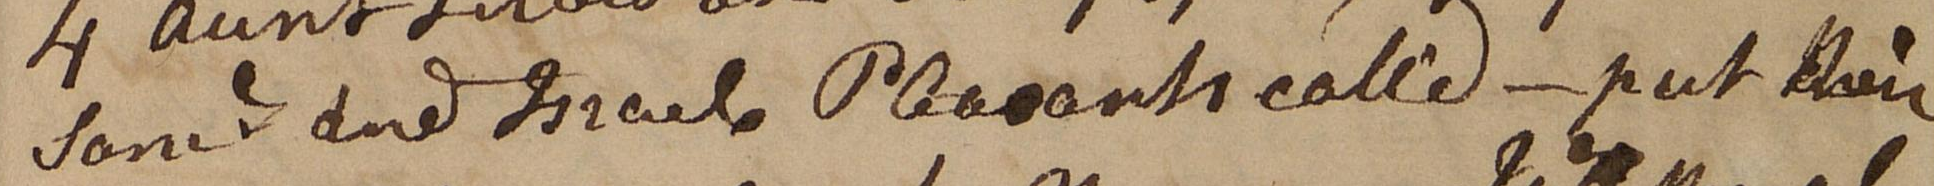Sam^l. and Israel Pleasants call'd- put their
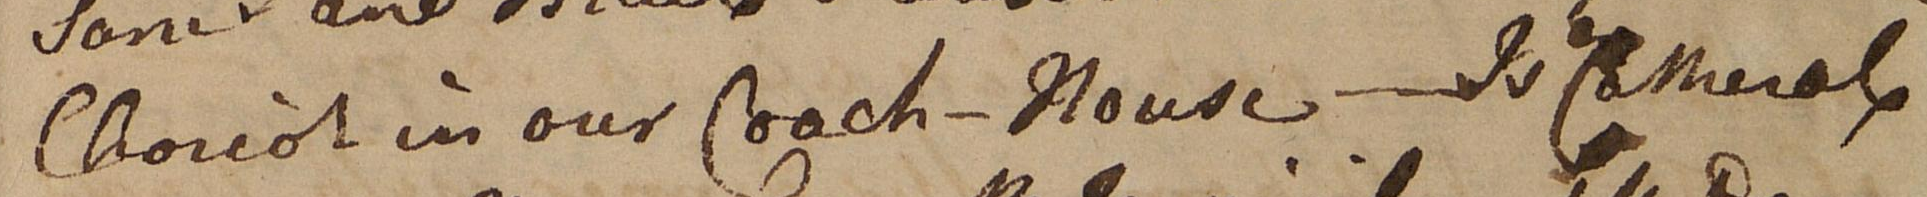Chariot in our Coach- House- Is^c Catheral
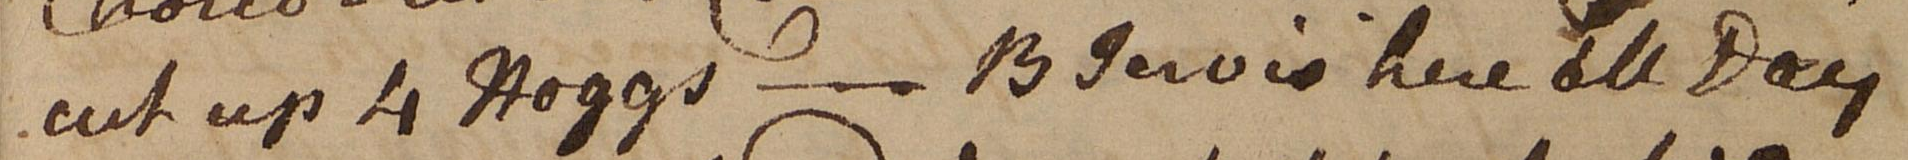cut up 4 Hoggs- B Jervis here all Day
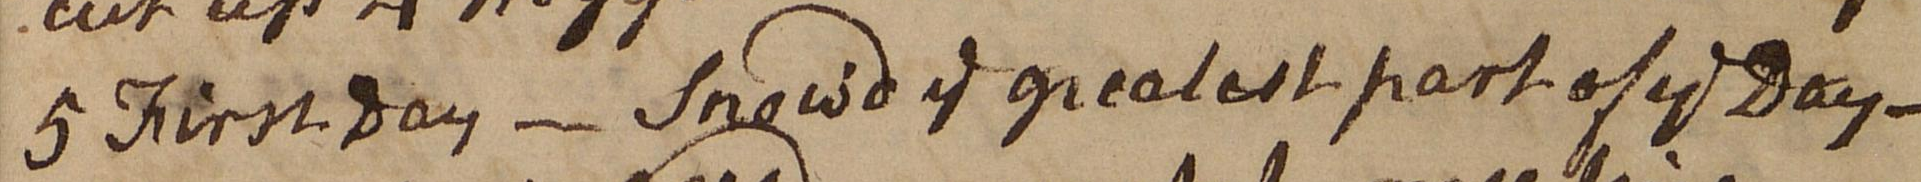5 First day- Snow'd y^e greatest part of y^e Day-
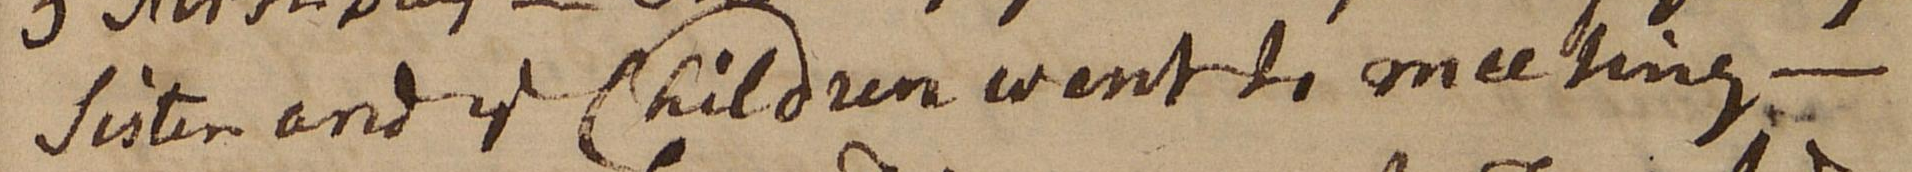Sister and y^e Children went to meeting-
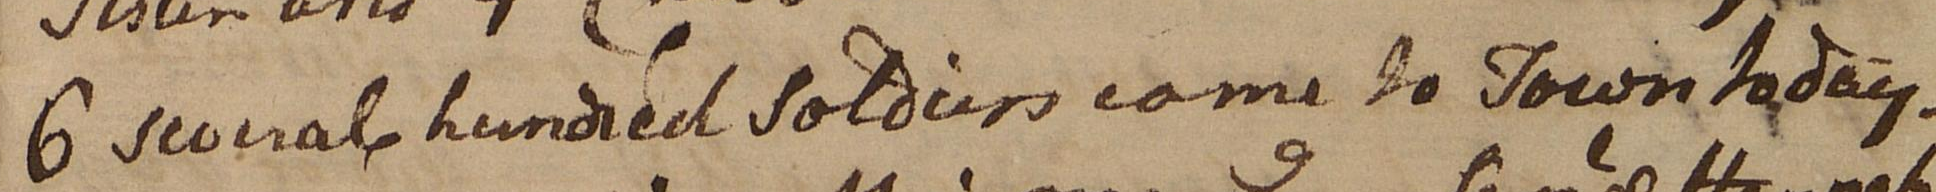6 several hundred Soldiers come to Town today-
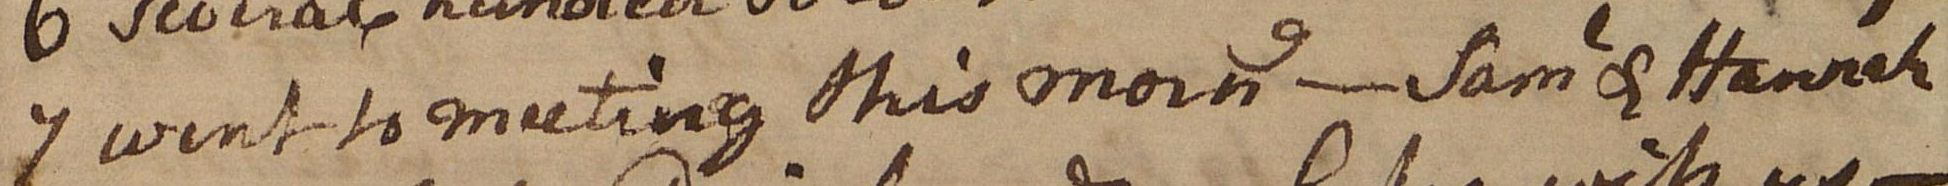I went to meeting this morn^g- Sam^l & Hannah
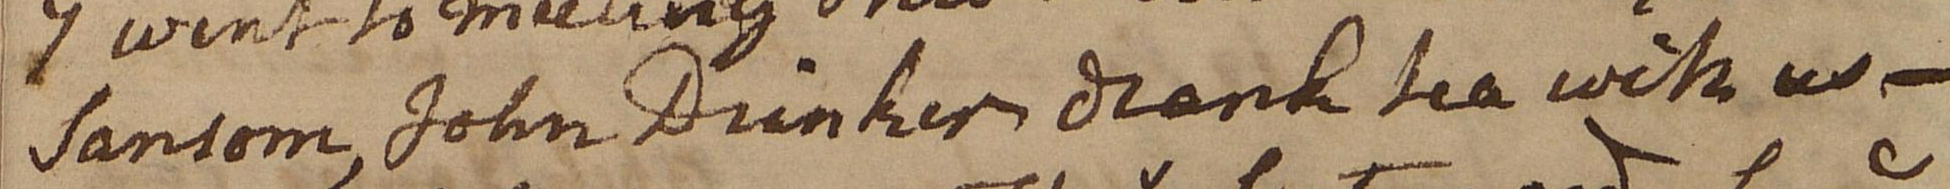Sansom, John Drinker drank tea with us-
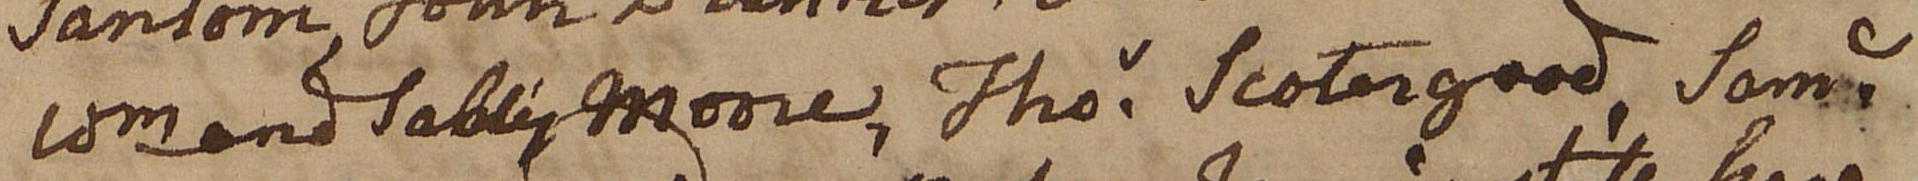W^m- and Sably Moore, Tho^s. Scatergood, Sam^l.
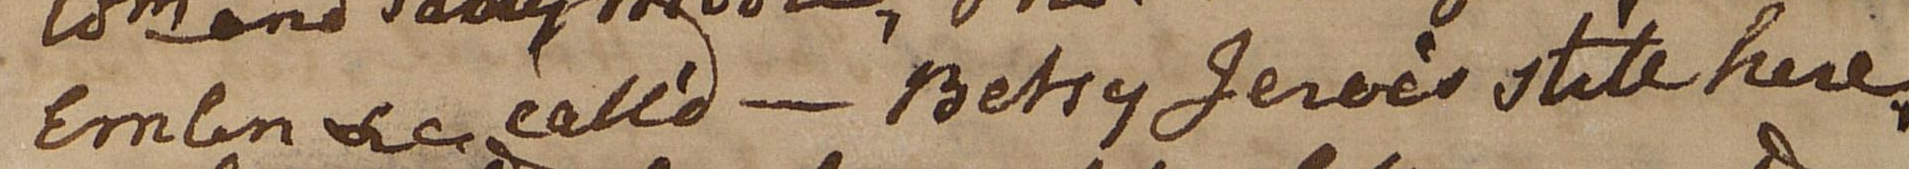Emlen &c call'd- Betsy Jervis still here,
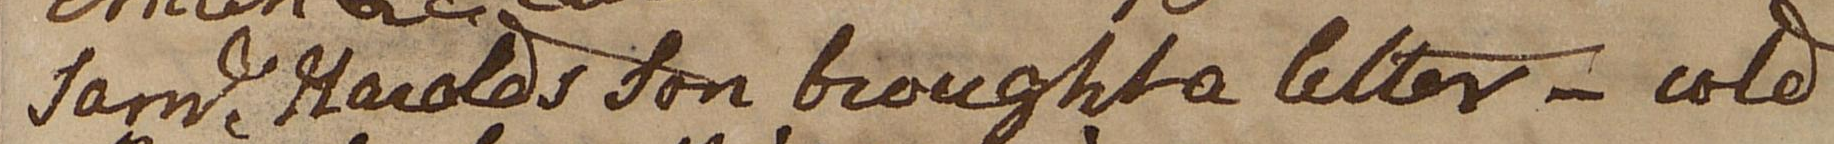Sam^l. Harolds Son broughta letter- cold
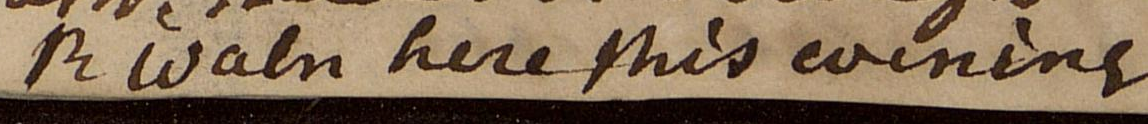R Waln here this evening
